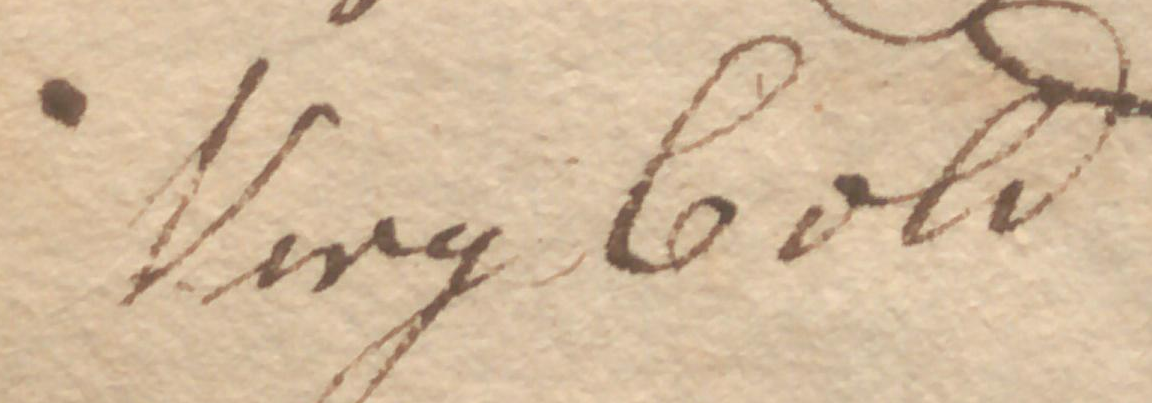Very Cold
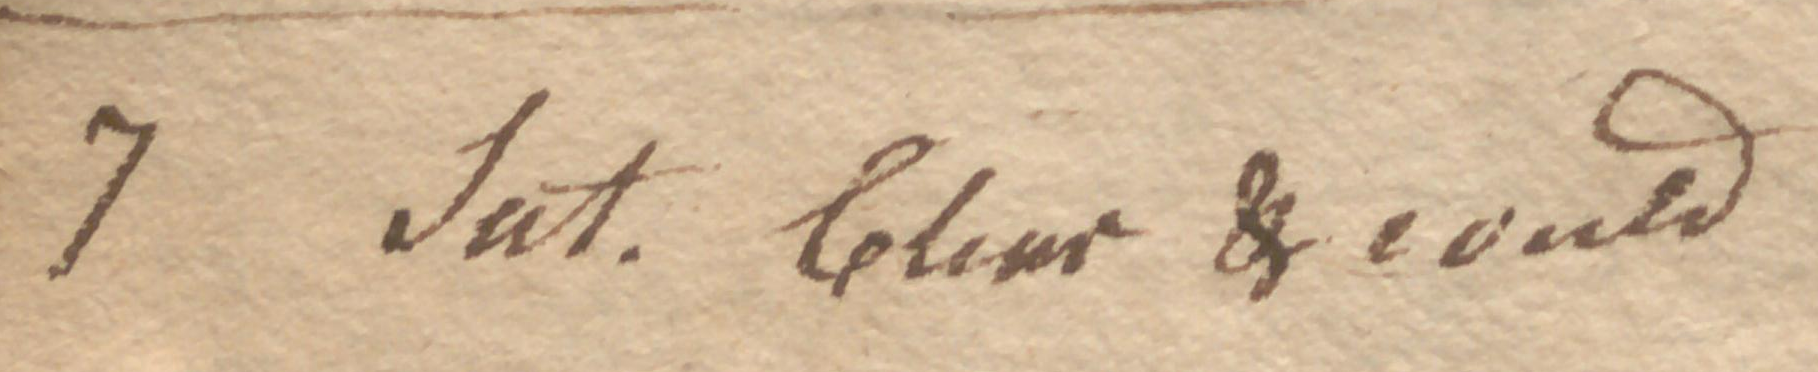7 Sat. Clear & could
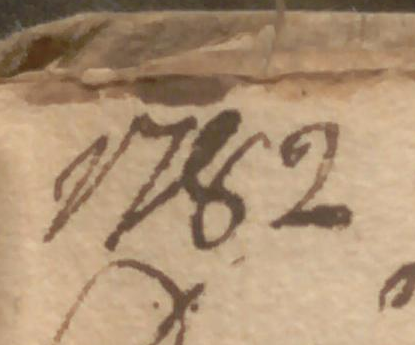1782
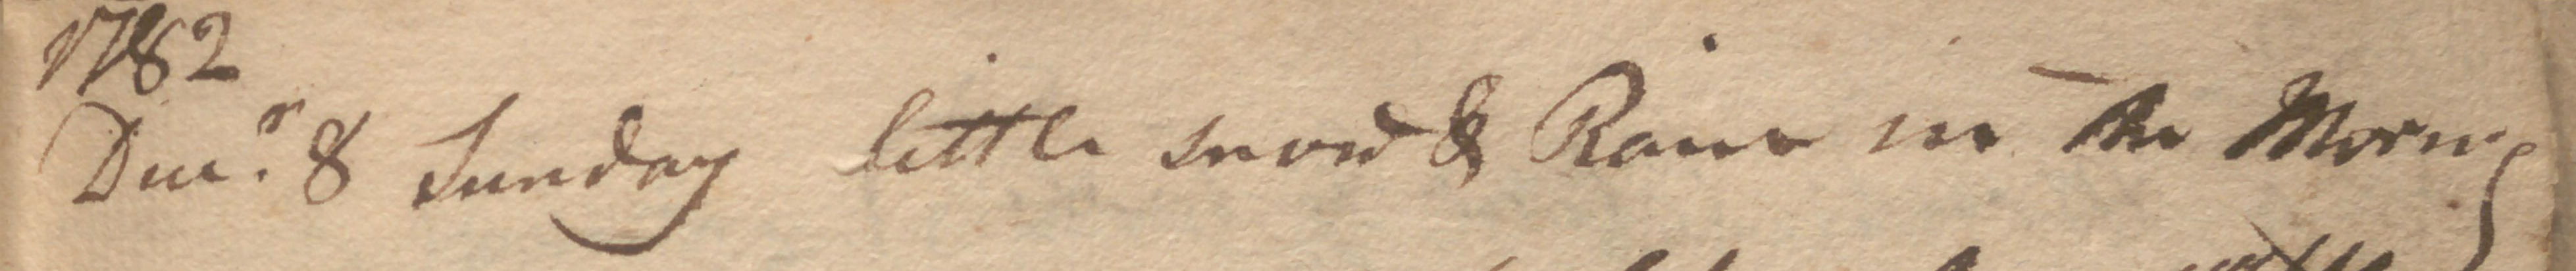Dec^r. 8 Sunday little snow & Rain in the Morng
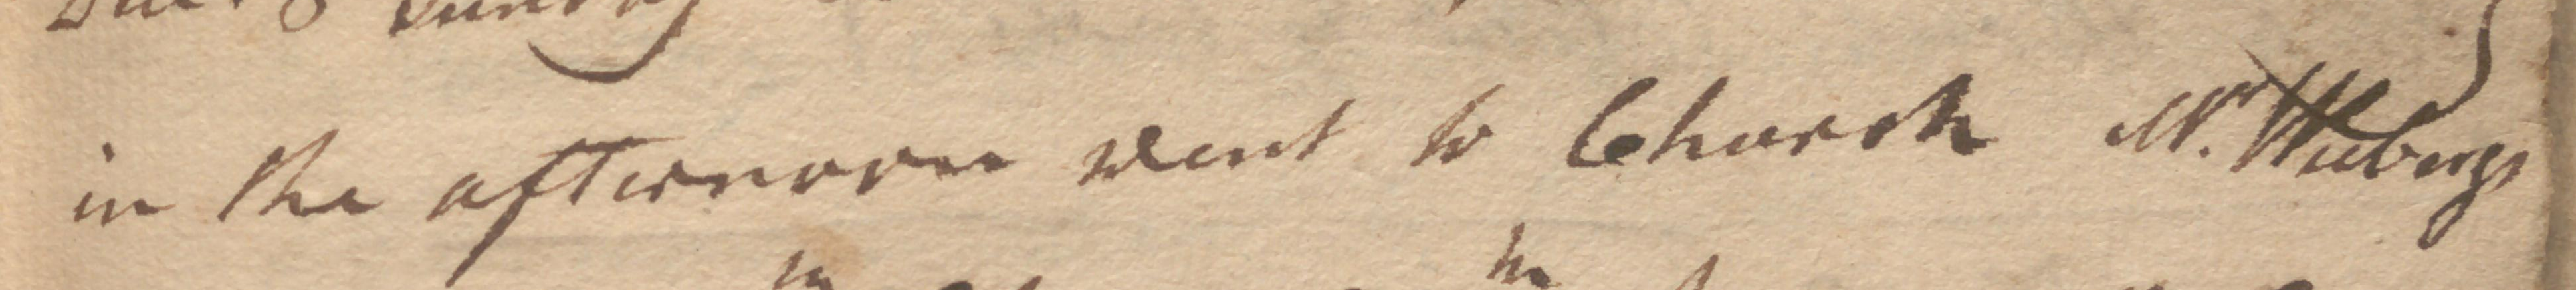in the afternoon went to Church M^r. Weibergs
